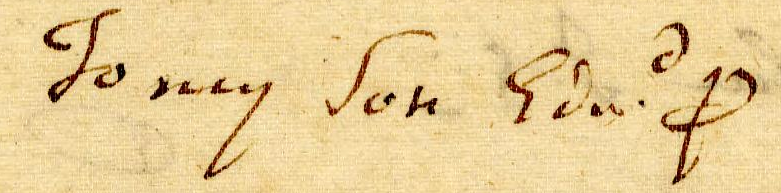To my Son Edw^d. S
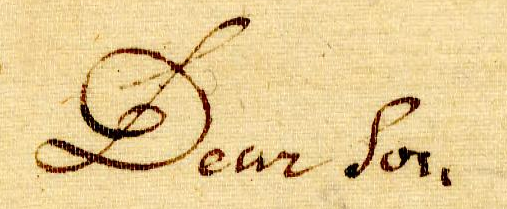Dear Son
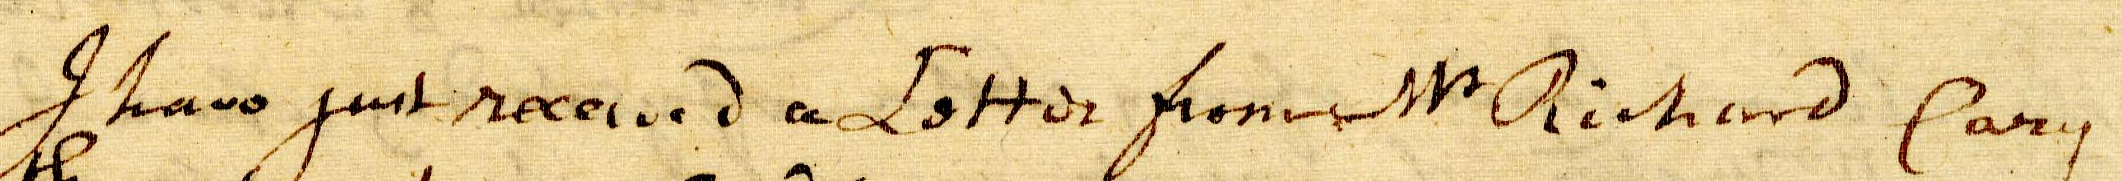I have just received a Letter from M^r Richard Cary
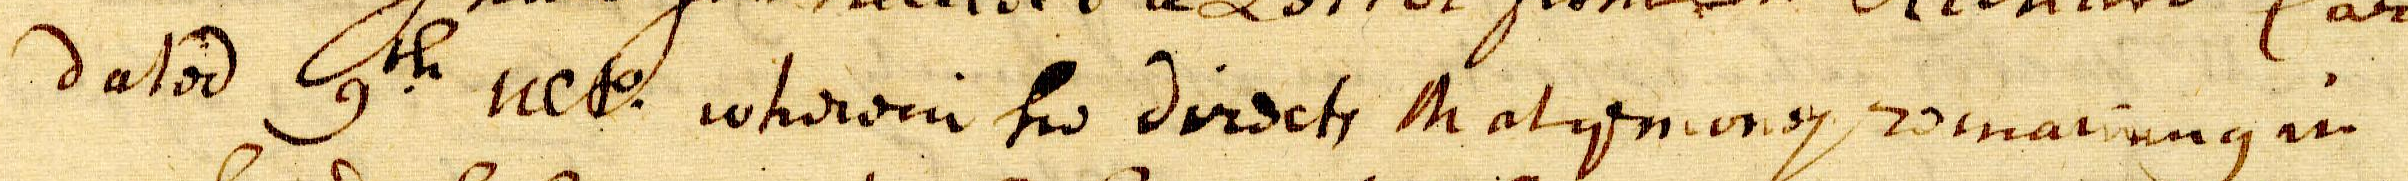dated 9^th ult^o. wherein he directs that y^e money remaining in
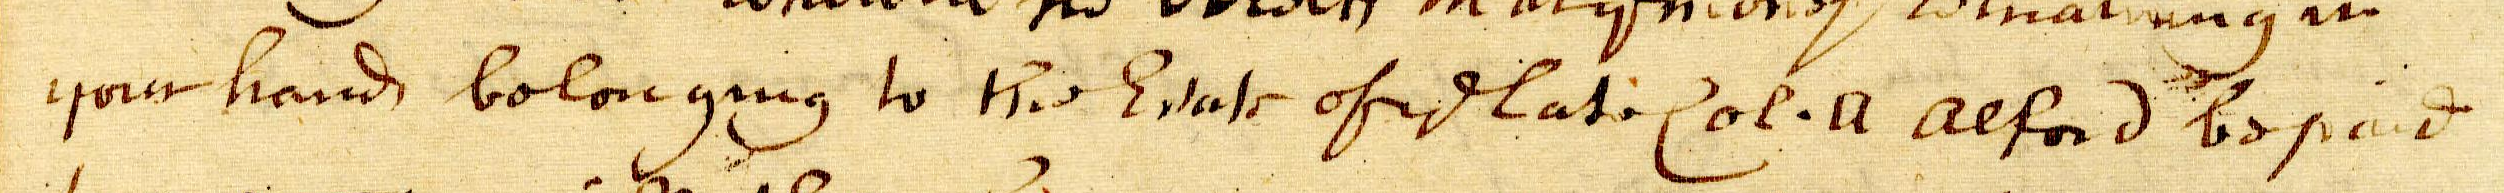your hands belonging to the Estate of y^e late Col. Alford be paid
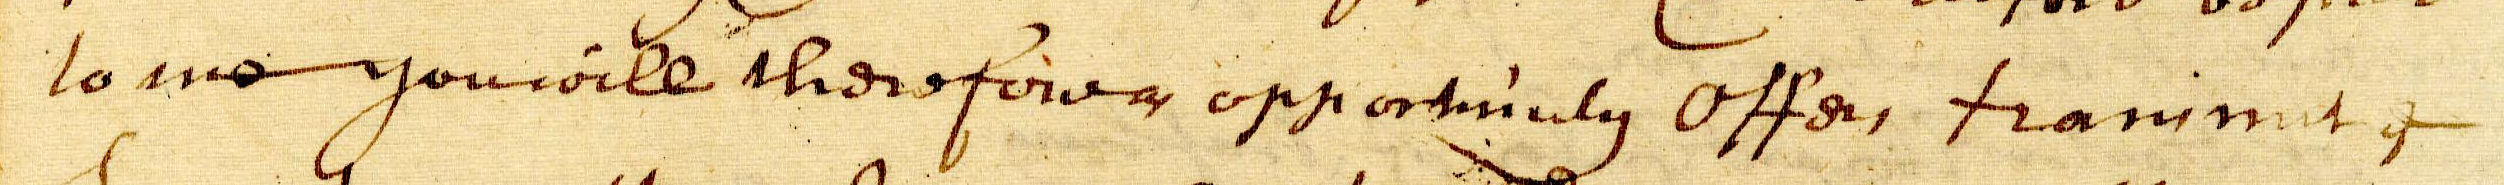to me you will there fore as opportunity Offers transmit of
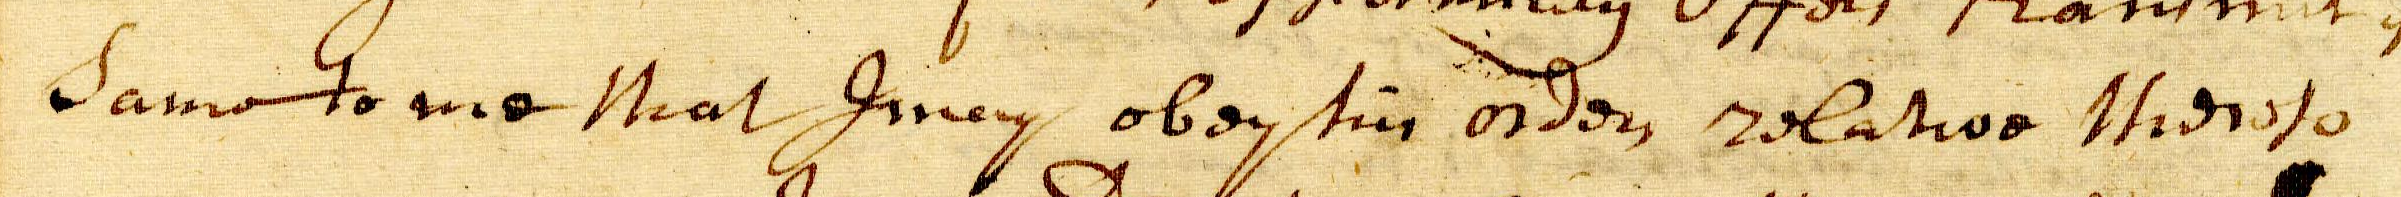Same to me that I may obey his orders relative thereto
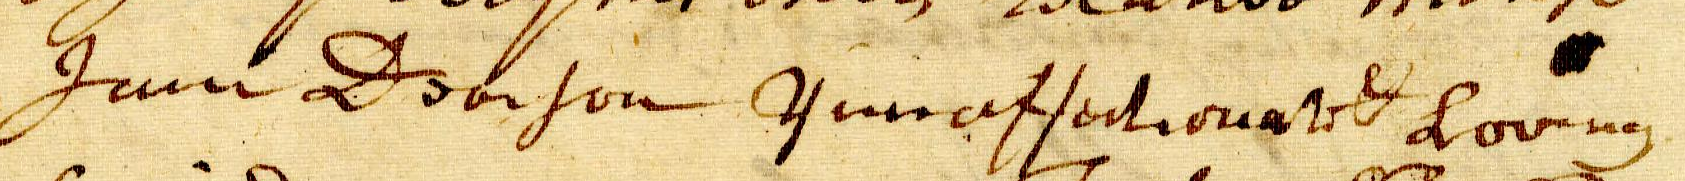I am Dear son your affectionate & Loving
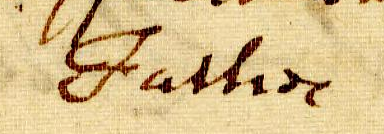Father
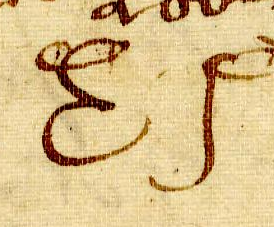ES
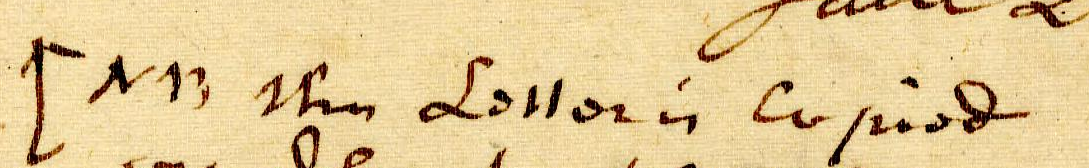[NB this Letter is copied
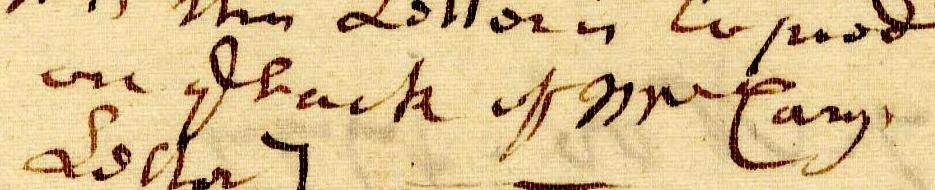on y^e back of M^r Carys
